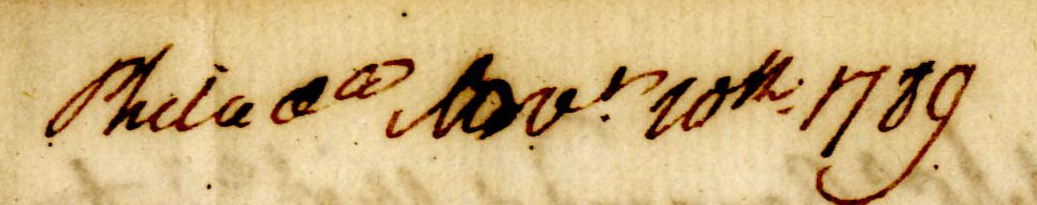Philad^a Nov^r. 10^th. 1789
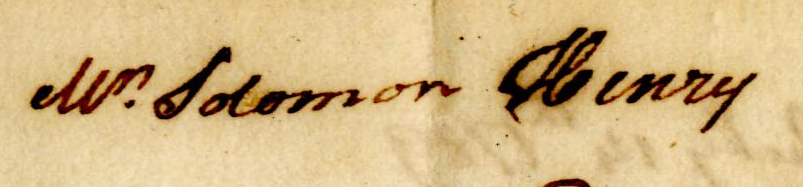M^r. Solomon Henry
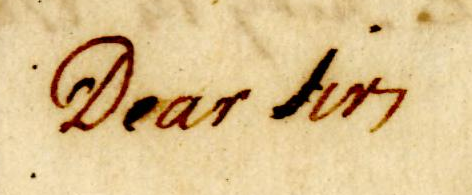Dear Sir
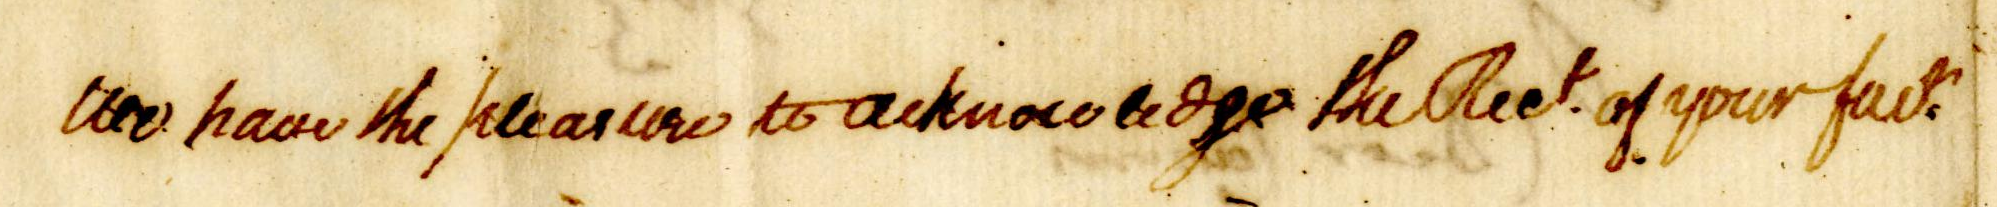We have the pleasures to acknoweledge. the Rec^t. of your fav^r.
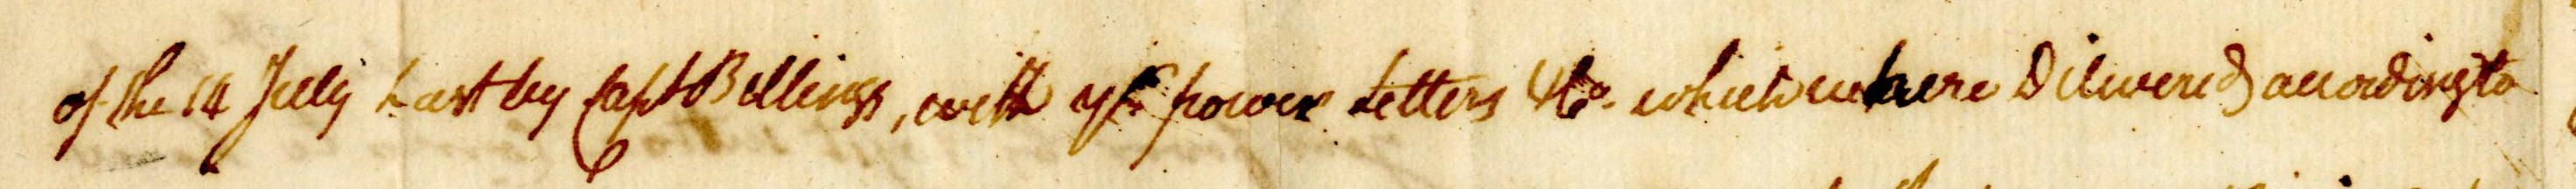of the 14 July last by Cap^t Bellings, with y^r. power Letters &. which we here Delivered according to
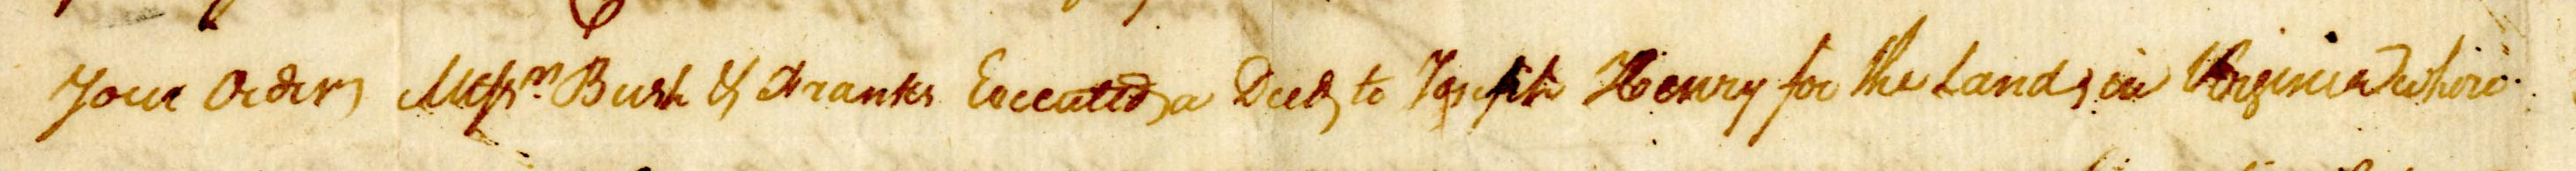your Orders Mess^rs. Bush & Franks Executed a Deed, to Joseph Henry for the lands in Virginia where
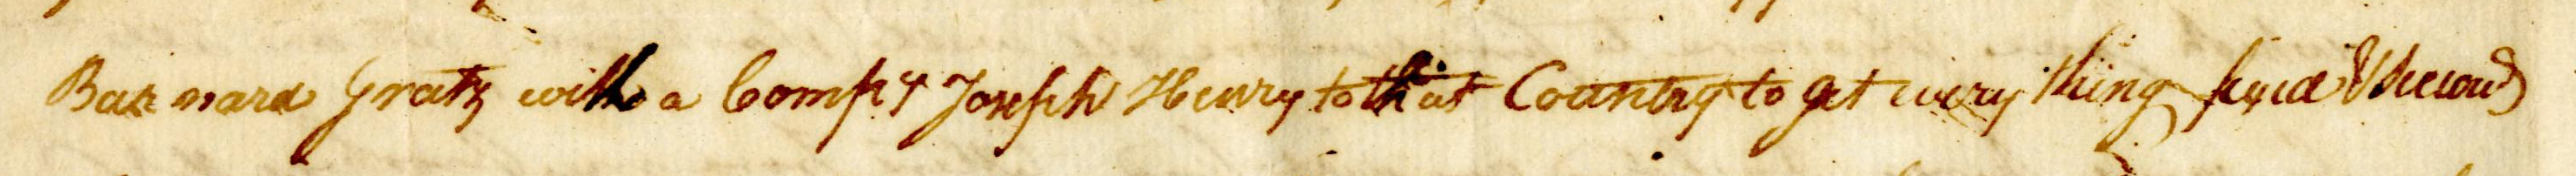Barnard Gratz with a Comp^y Joseph Henry to that Country to get every thing fixd & secured
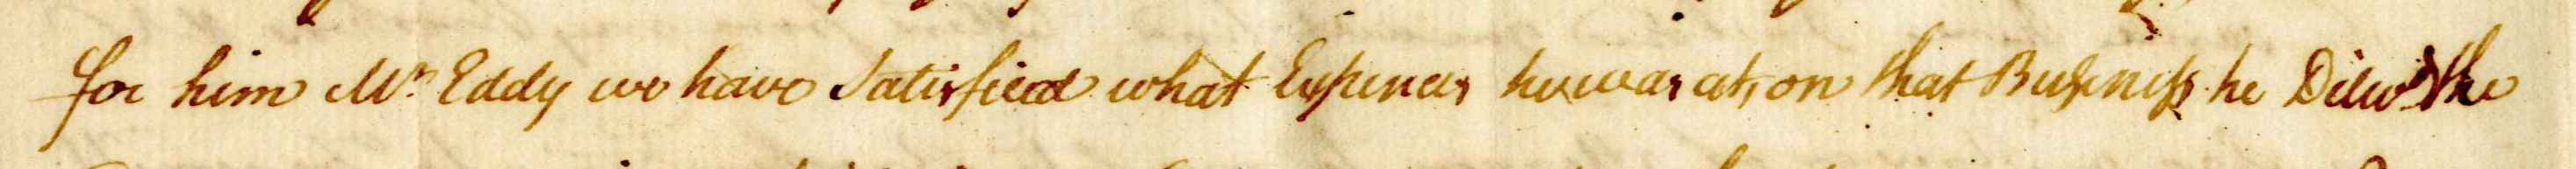for him M^r. Eddy we have Satisfied what Expenses he was at, on that Business he Deliv^d the
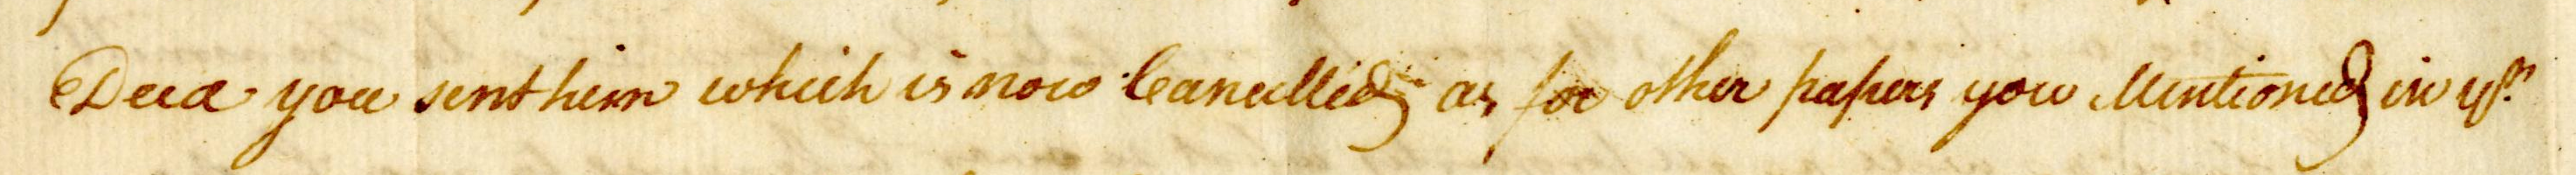Deed you sent him which is now Cancelled as for other papers you Mentioned in y^r.
